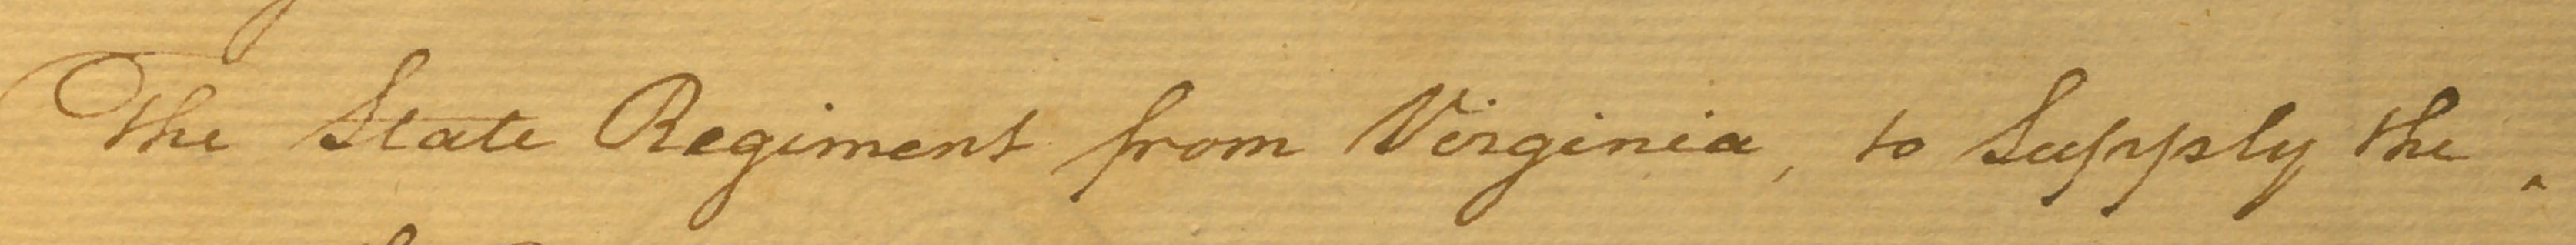The State Regiment from Virginia, to Supply the
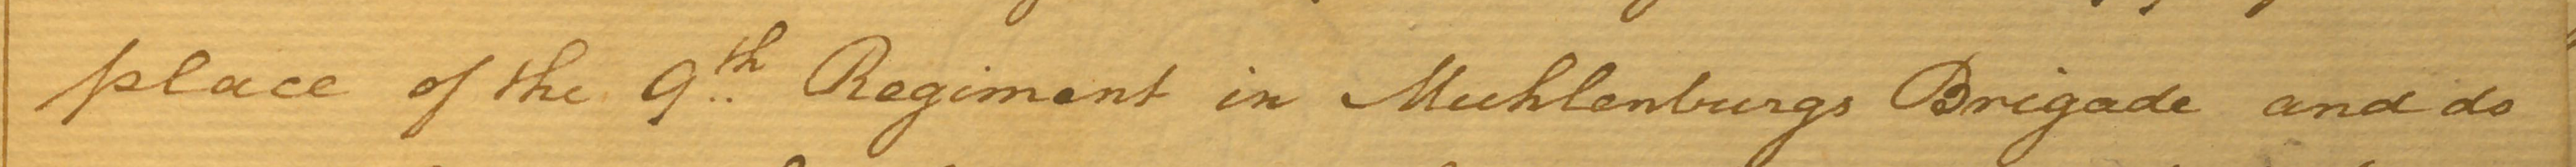place of the 9^th. Regiment in Muhlenburgs Brigade and do
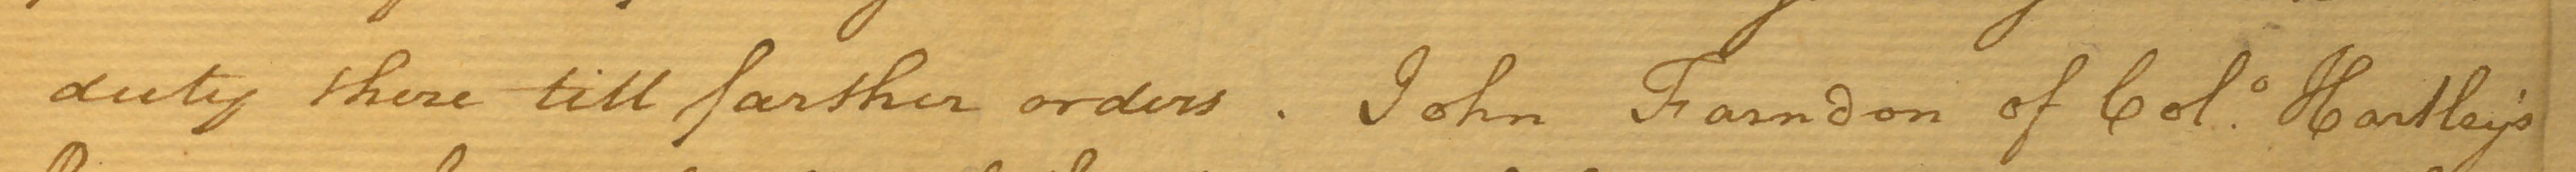duty there till farther orders. John Farndon of Col^o. Hartley's
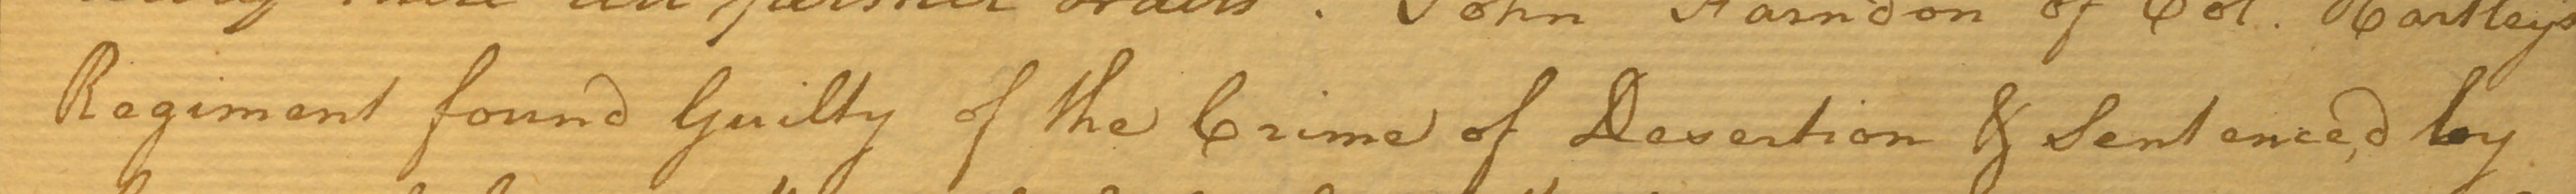Regiment found Guilty of the Crime of Desertion & sentenced by
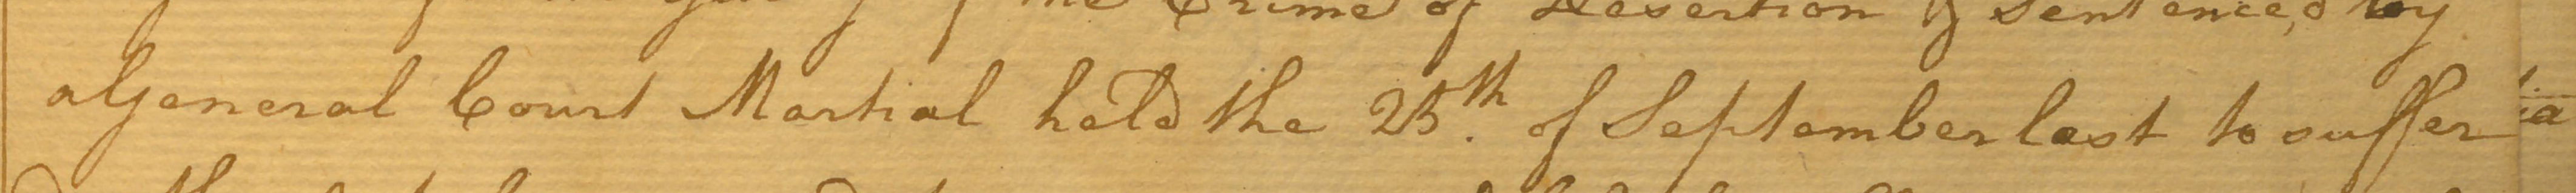a General Court Martial held the 25^th of September last to suffer
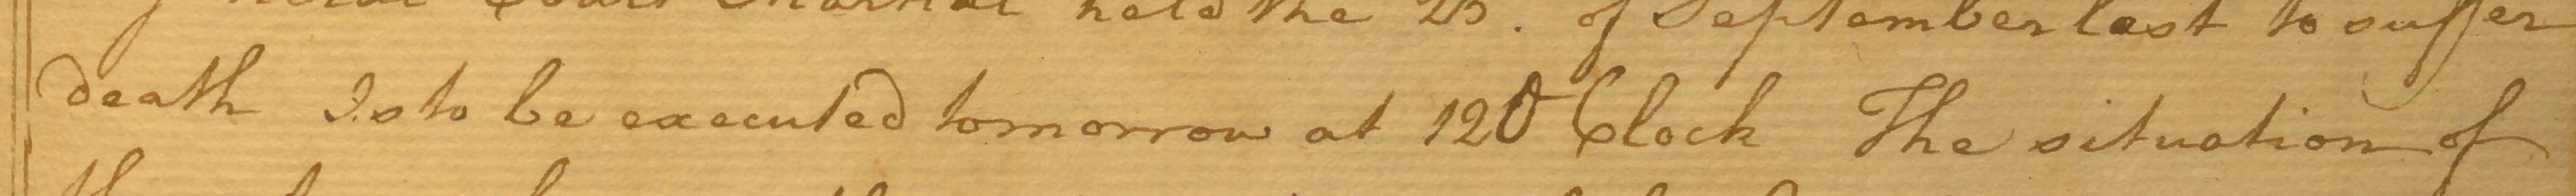death Is to be executed tomorrow at 12 OClock The situation of
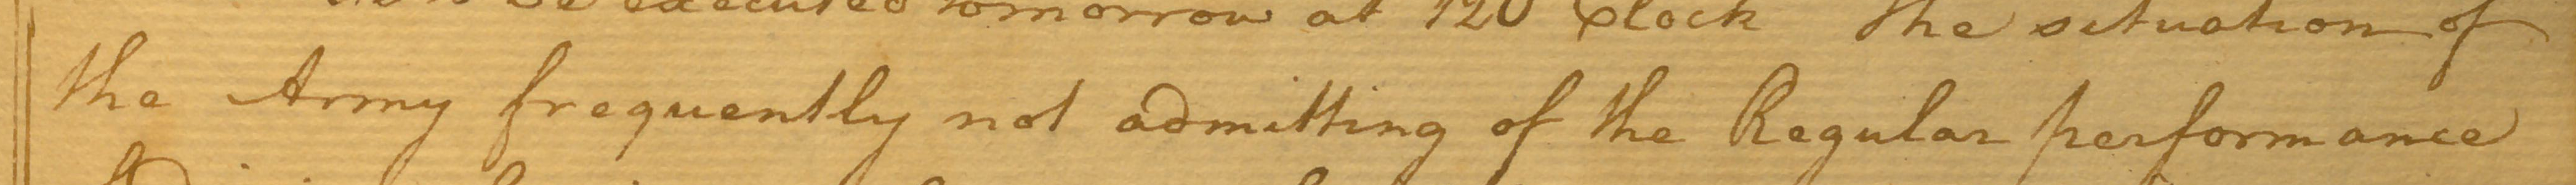the Army frequently not admitting of the Regular performance
